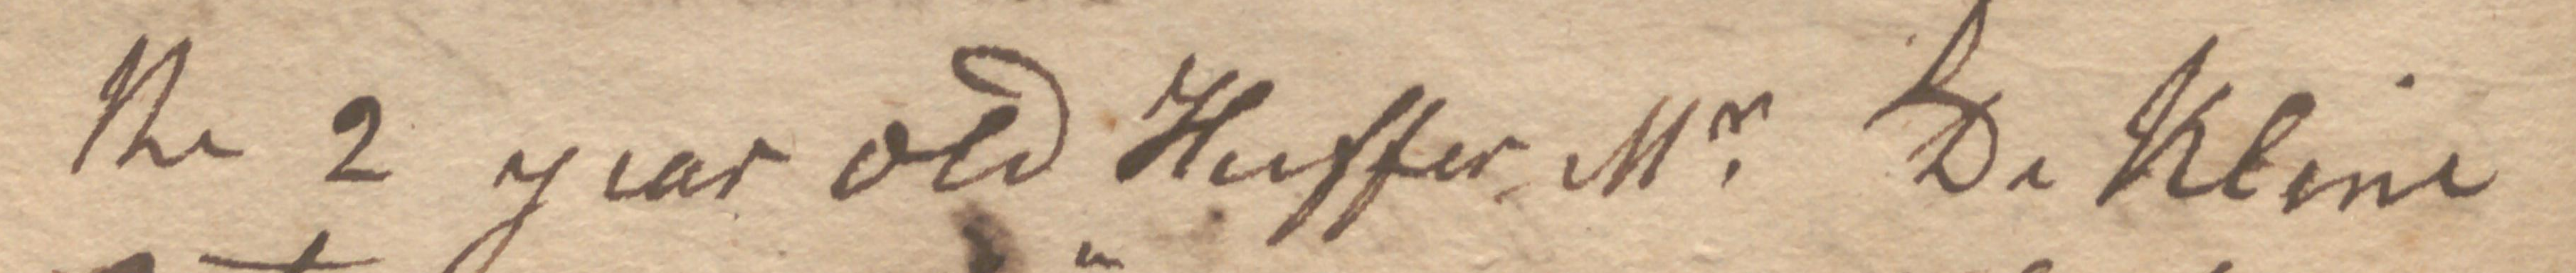the 2 year old Heiffer M^r. DeKline
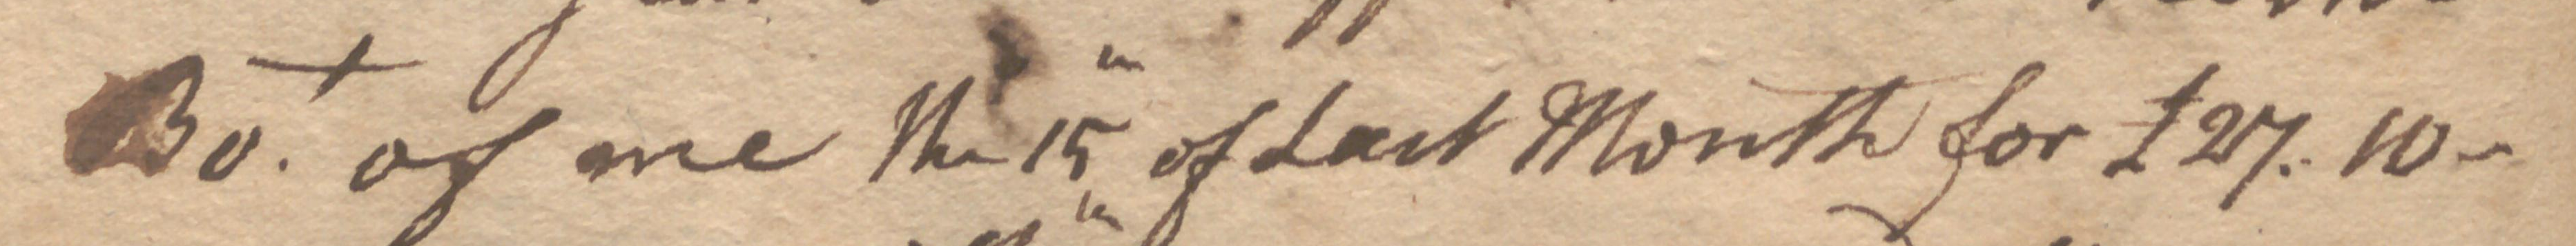Bo^t. of me the 15^th of Last Month for £27.10-
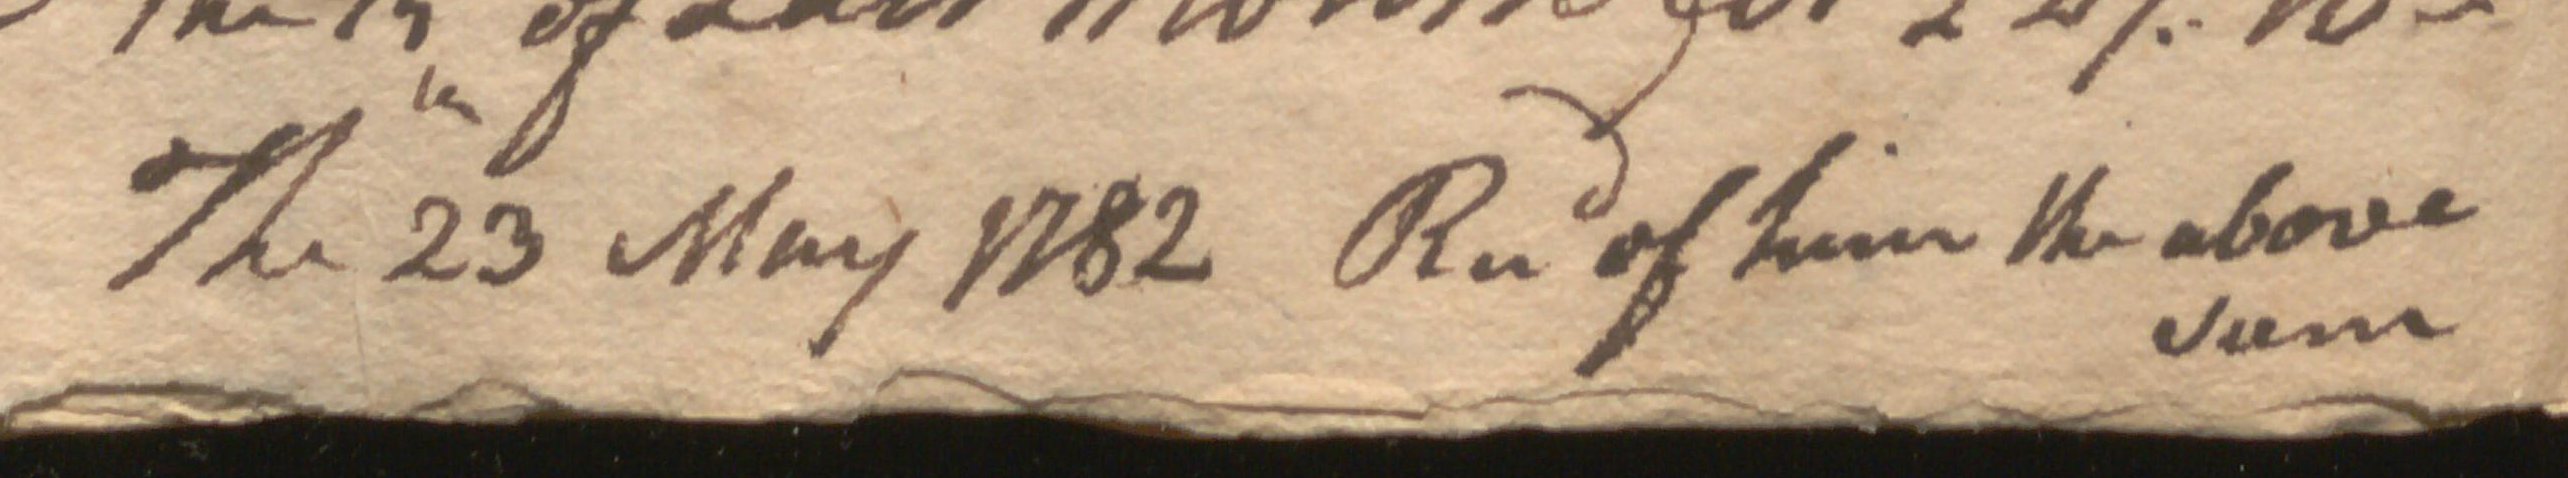The 23^h May 1782 Re^d of him the abve
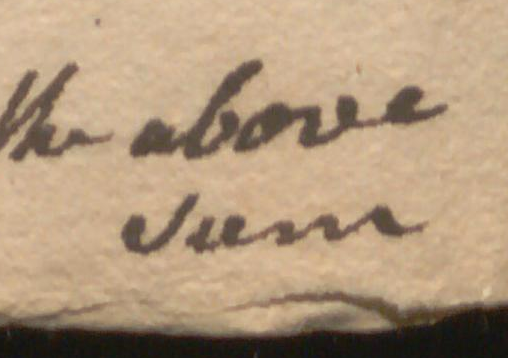sum
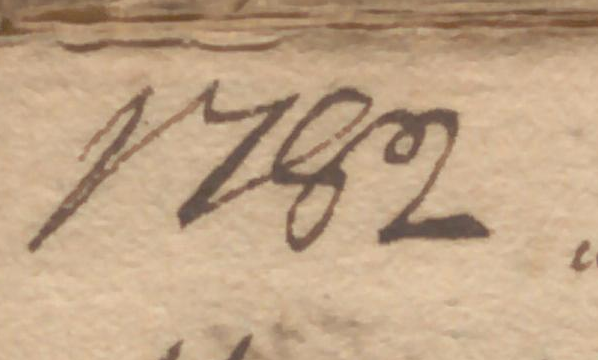1782
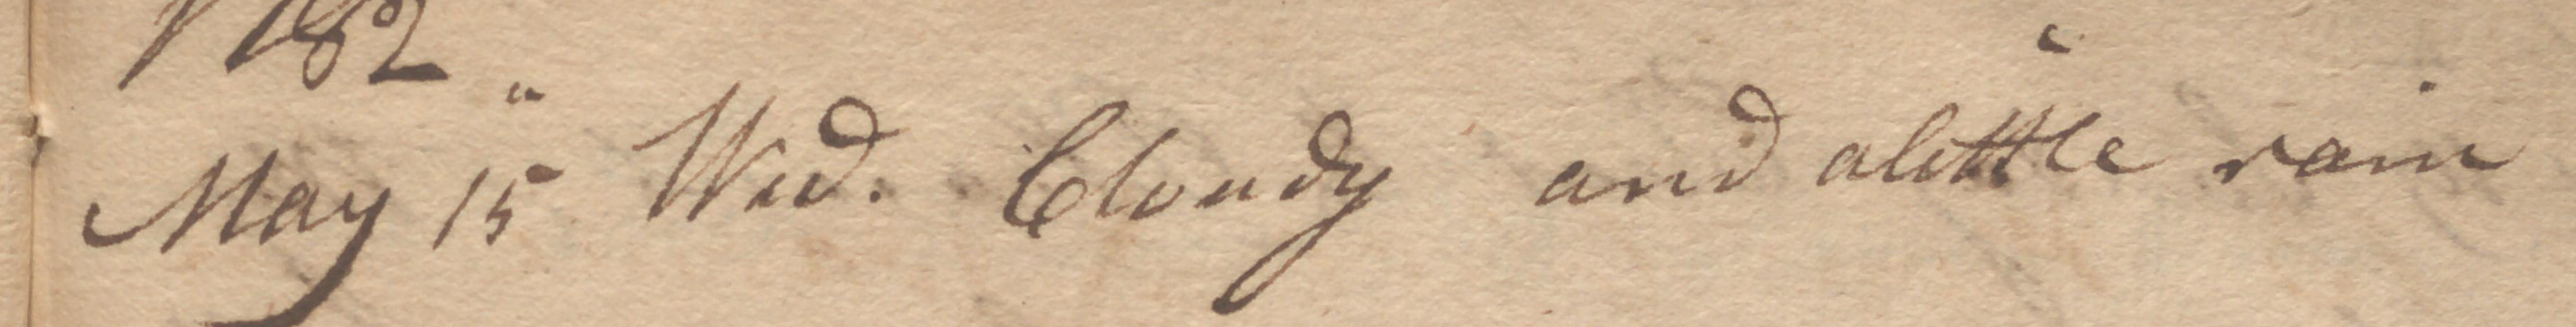May 15 Wed. Cloudy and a little rain
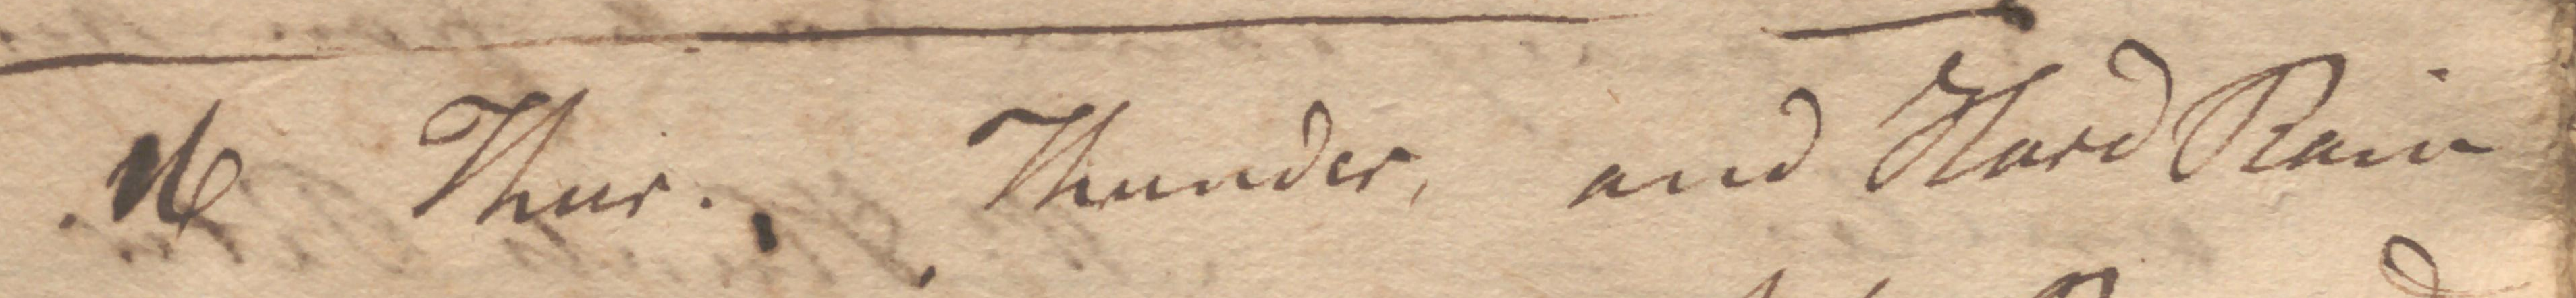16 Thur. Thunder, and Hard Rain
